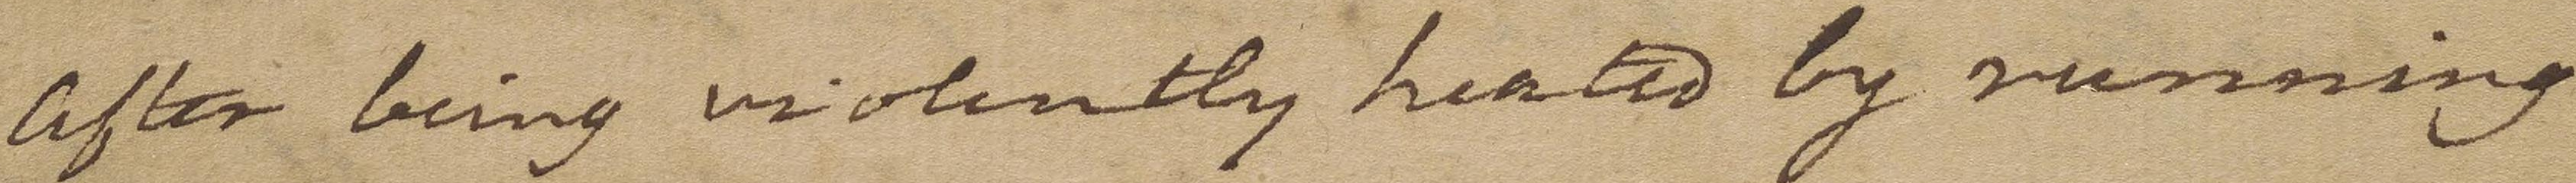after being violently heated by running
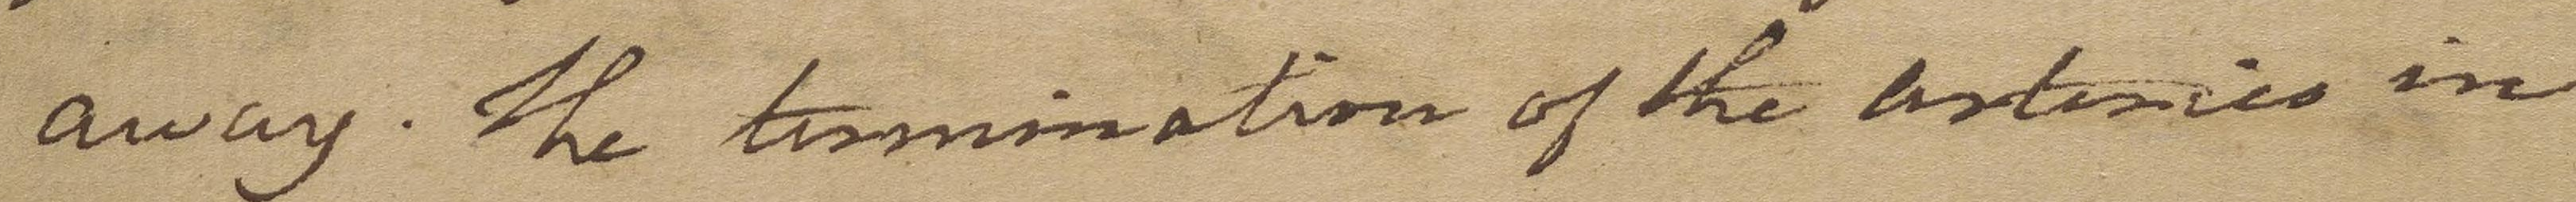away. The termination of the arteries in
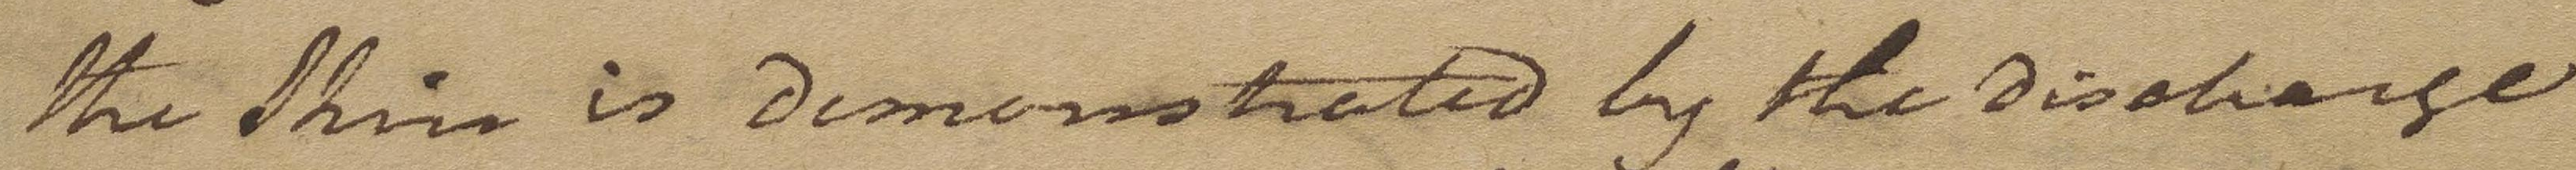the shin is demonstrated by the discharge
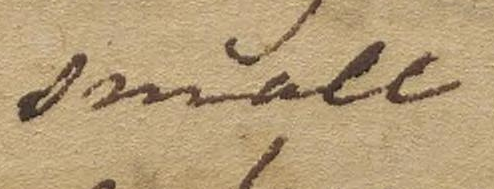small
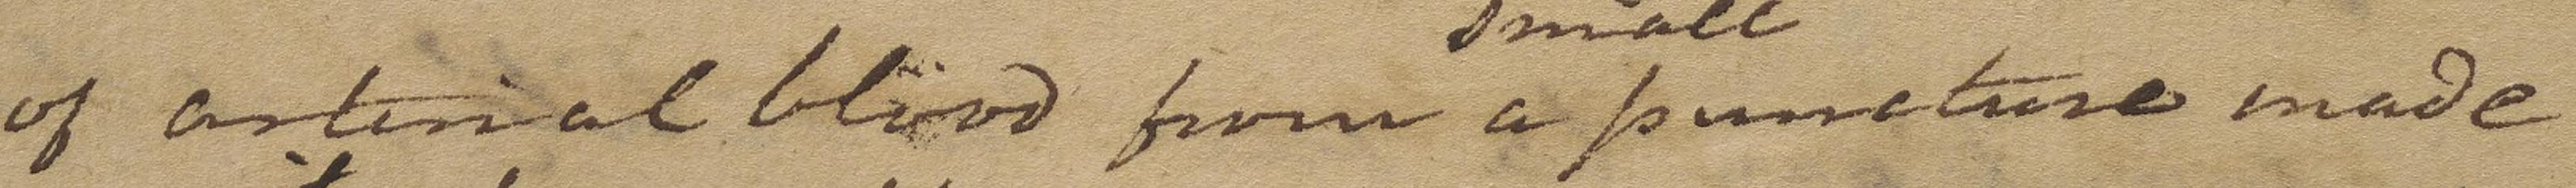of arterial blood from a ^ puncture made
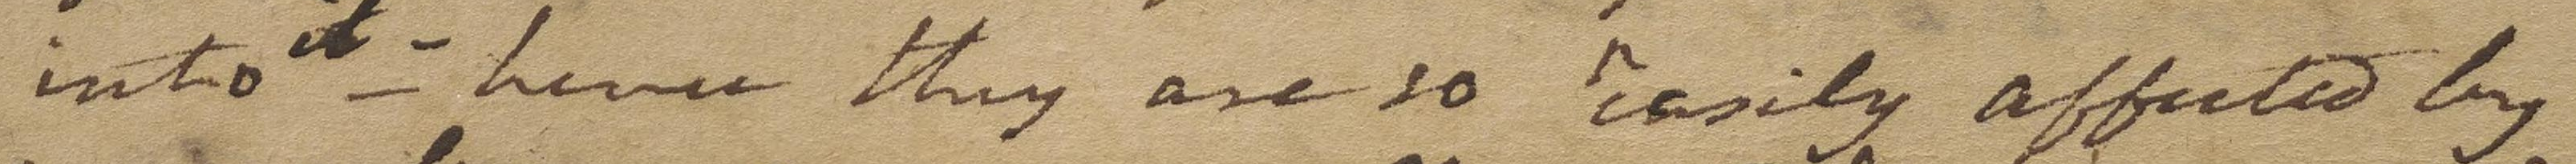into it, here they are so easily affected by
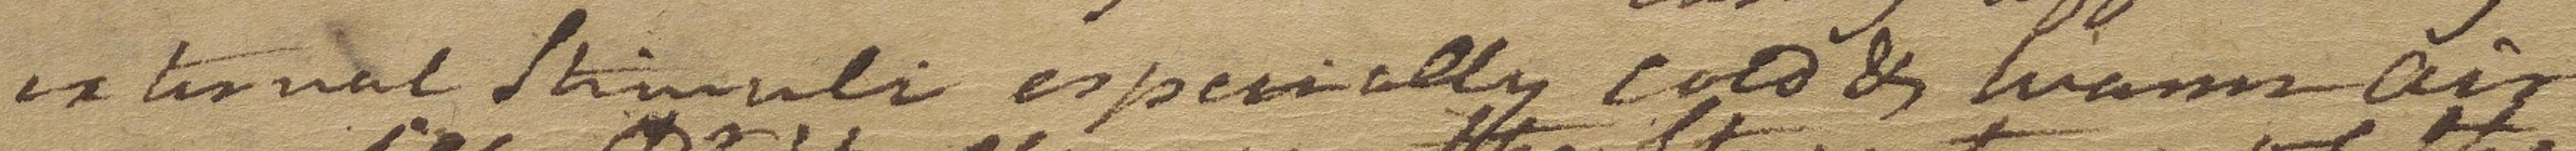external stimuli especially cold & warm air
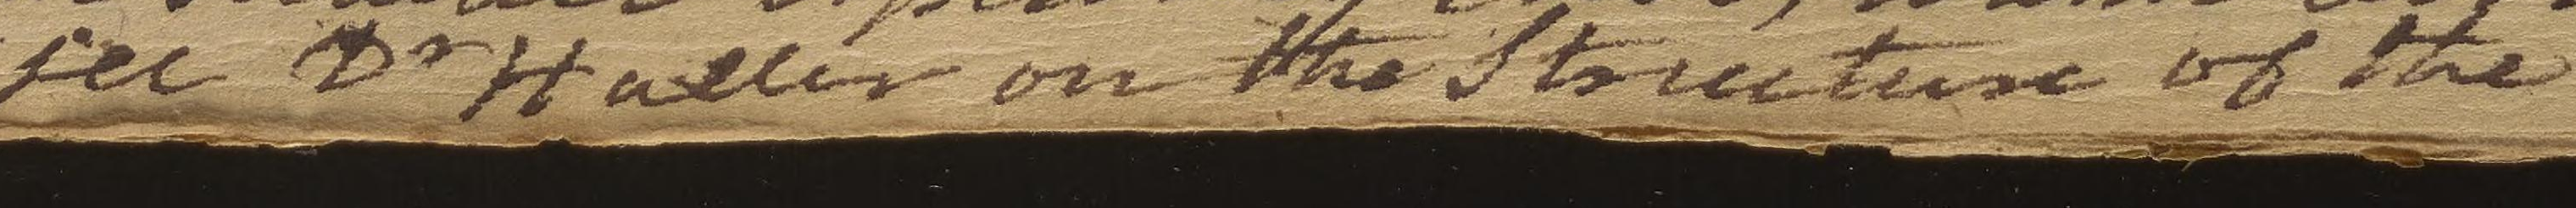per Dr. Haller on the structure of the
